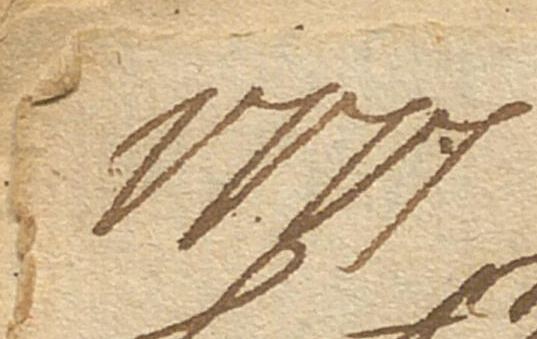1777
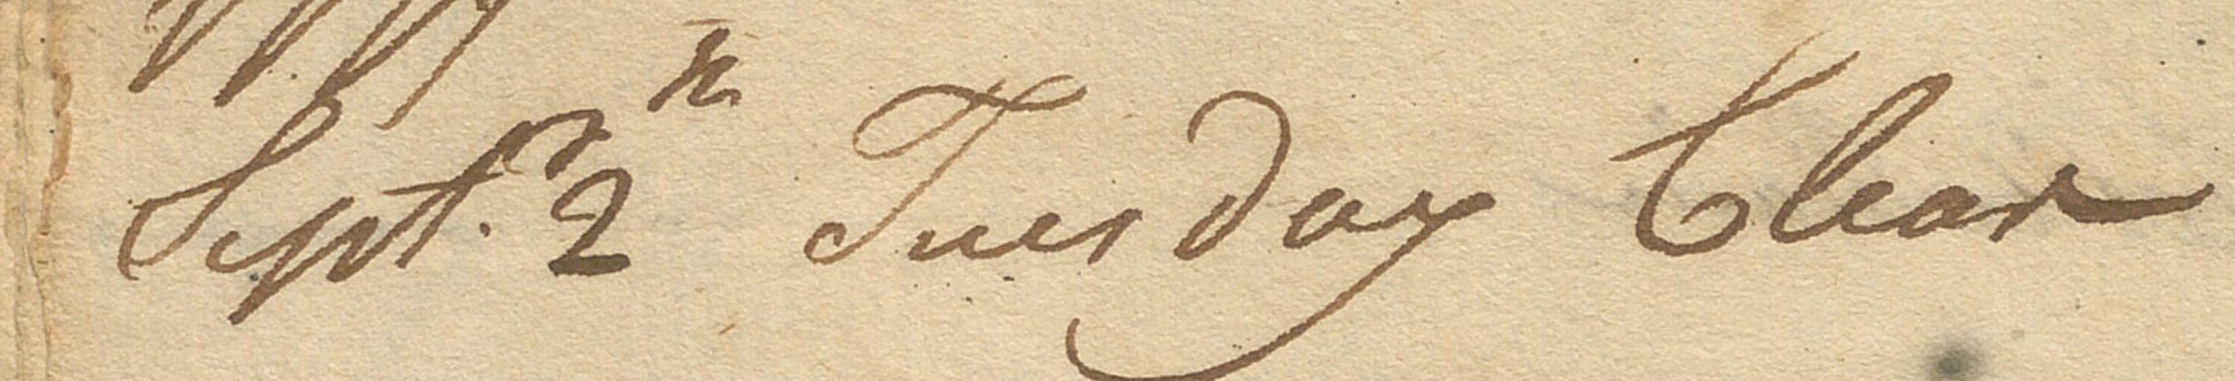Sept^r. 2^th Tuesday Clear
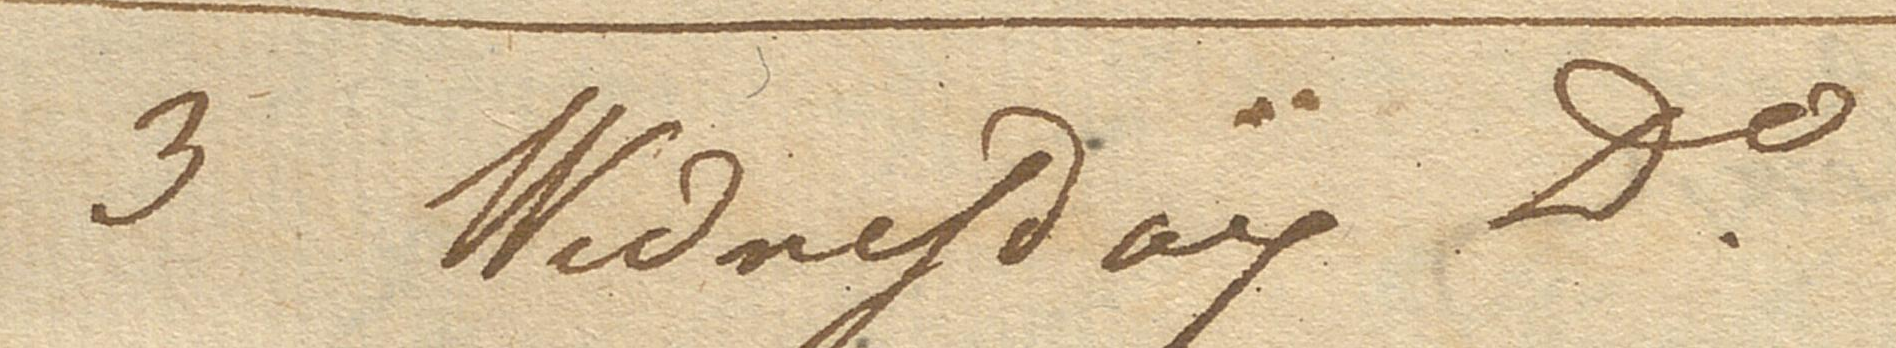3 Wednesday D^o.
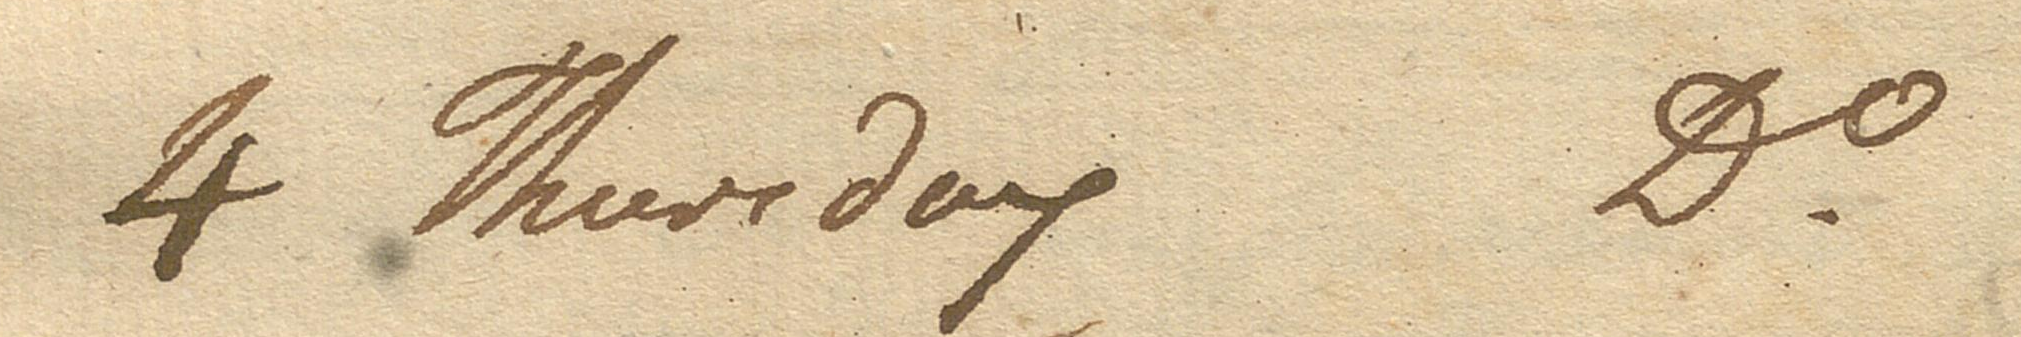4 Thursday D^o.
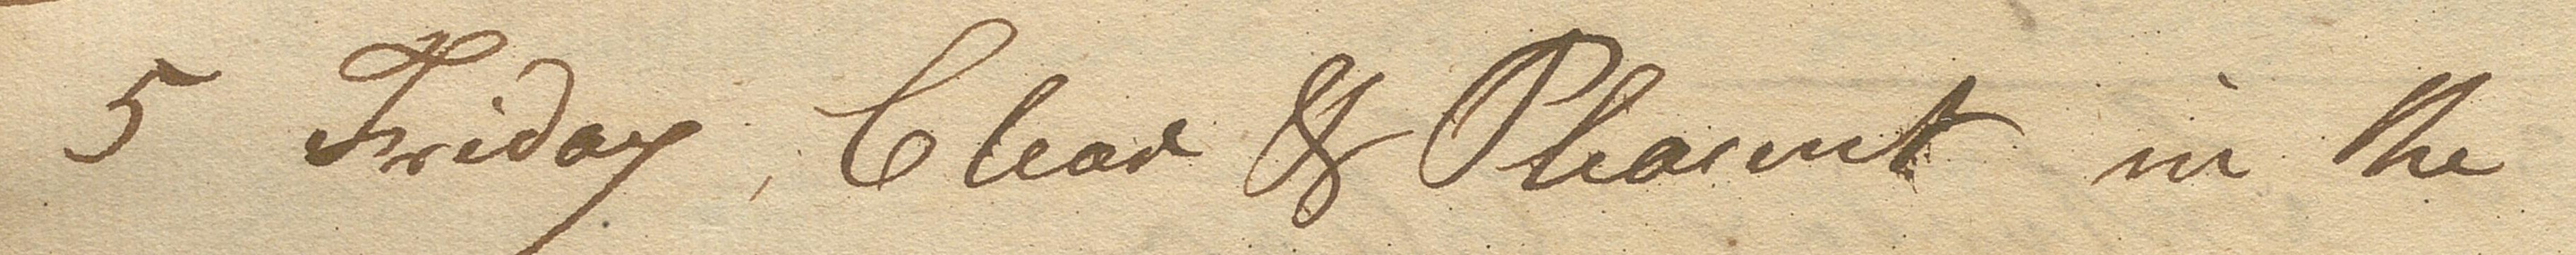5 Friday Clear & Pleasent in the
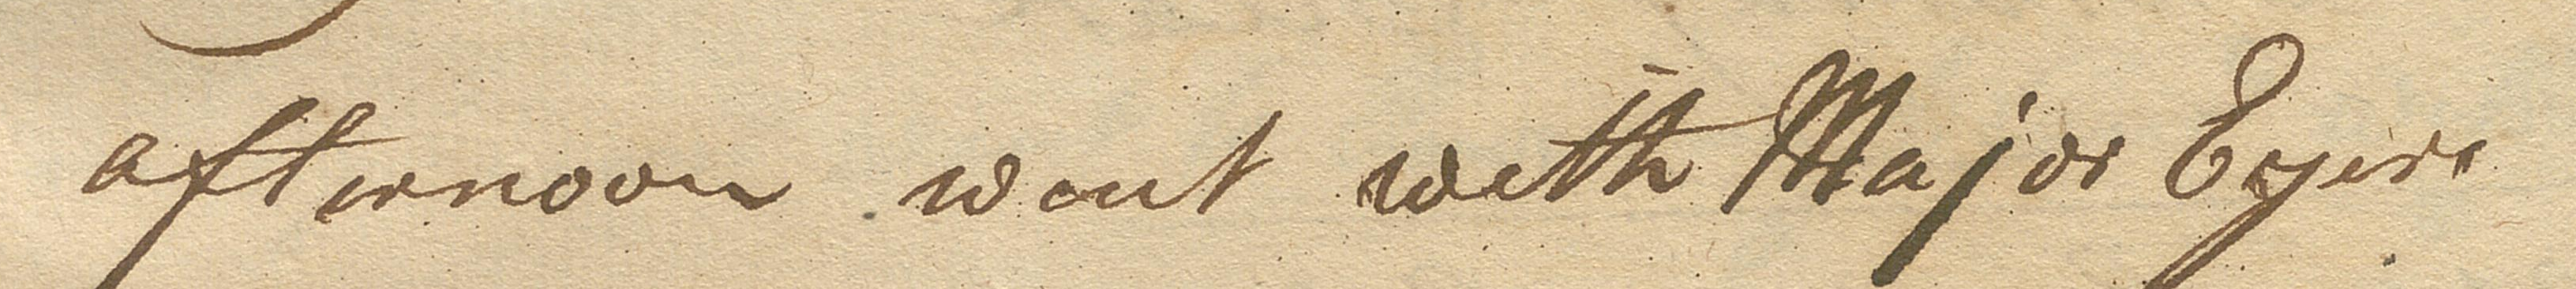afternoon went with Major Eyers
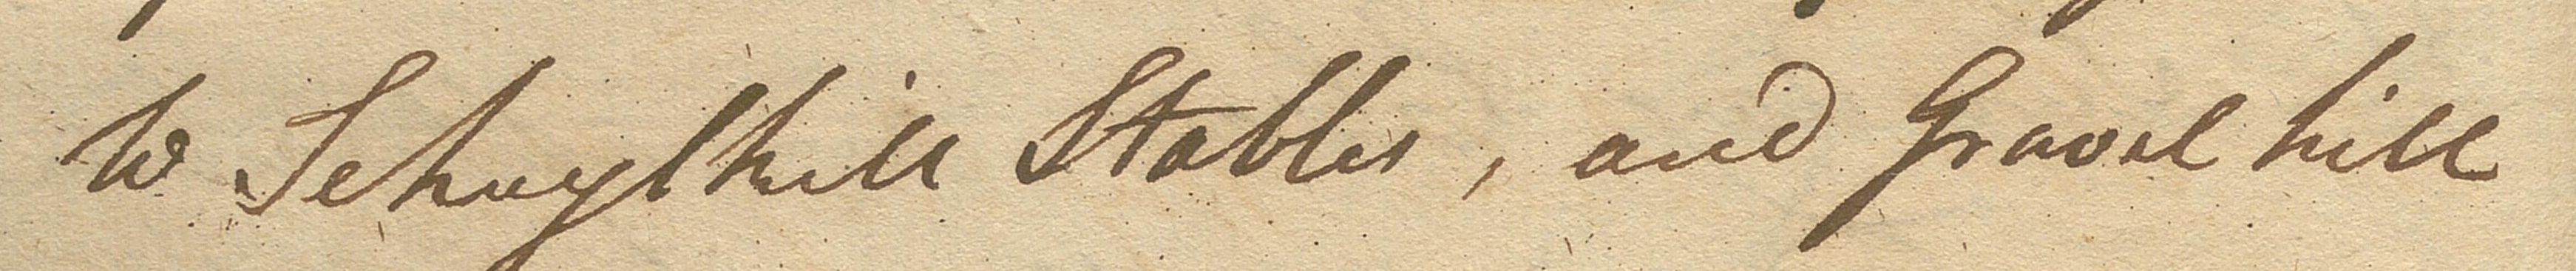to Schuylkill Stables, and Gravel hill
